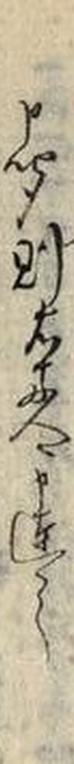申聞則右両人へ申達之
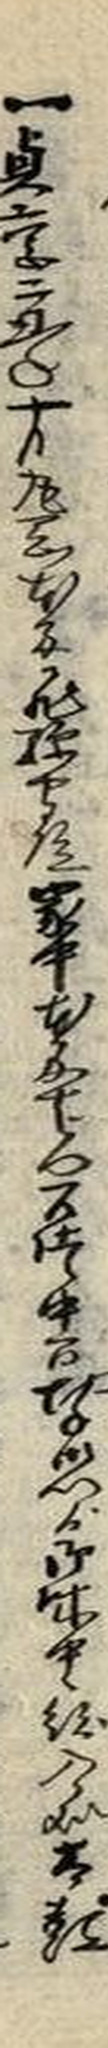一貞享二丑年十月丸岡本多飛騨守殿家中本多十郎右衛門召仕候中間切手御門ゟ御城中へ紛入候処太鼓
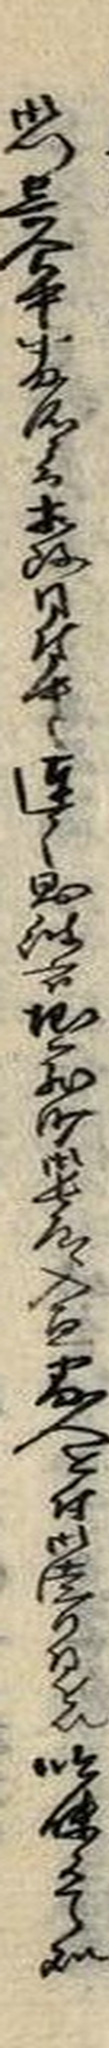御門寄合中番所ニ而相改目付中へ達候則彼者地蔵町御長屋へ入置番人を付御徒目付を以吟味有之候処
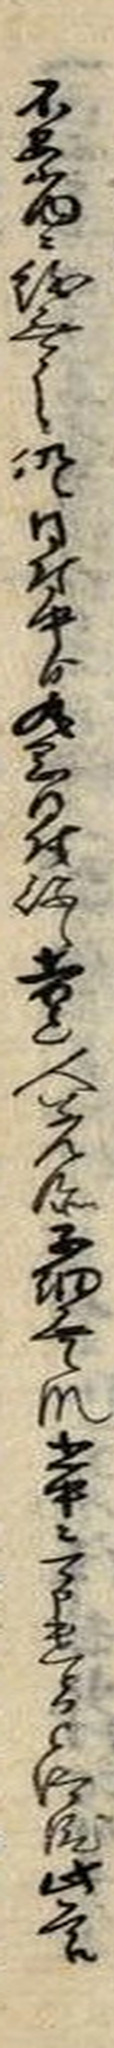不案内ニ紛無之仍之目付中ゟ丸岡目付役之者迄人差添子細無之段書中ニ可申遣旨被仰渡此節
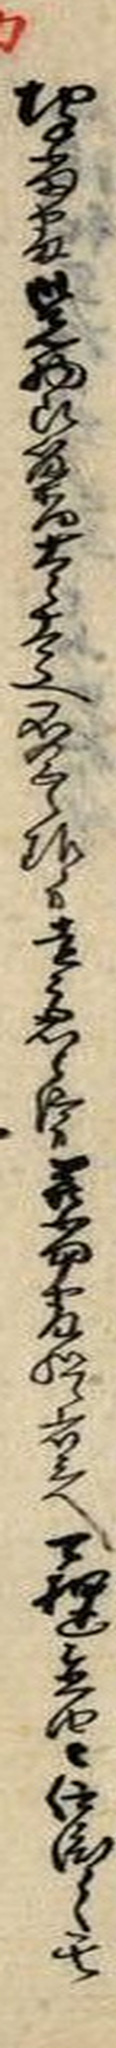切手当番御先物頭簗田太郎太夫不念之趣ニ付遠慮被仰付并当番組之者三人可押込置由被仰渡候其

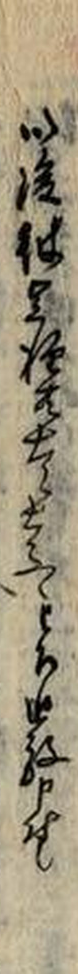以後彼足軽共太郎太夫へ被下追放申付候
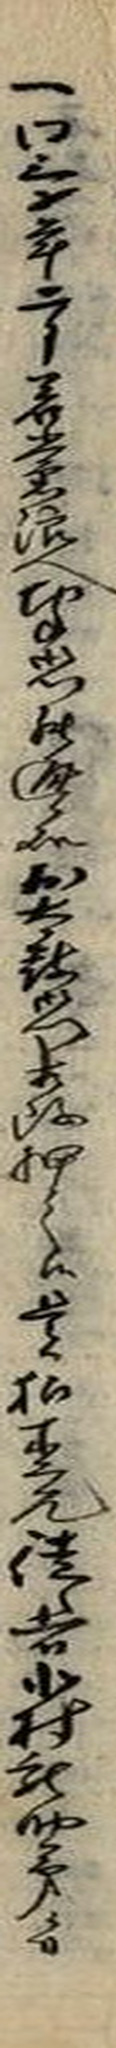一同三寅年二月若党浪人切手御門罷通候処於太鼓御門相改押之候是は狛杢允徒之者小村新助弟に付
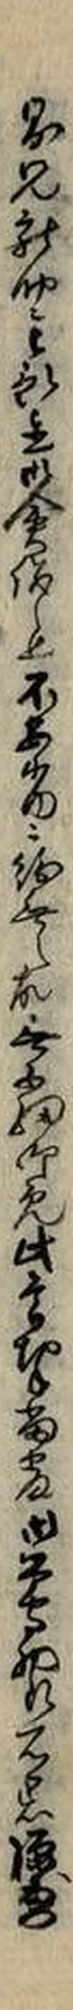則兄新助に被預置御僉議之上不案内に紛無之故無子細御免此節切手当番御留守物頭石黒源五右衛門
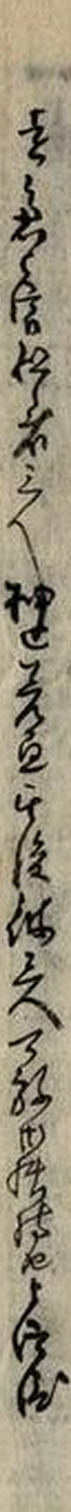遠慮被仰付組之者三人押込差置其後彼三人可放御扶持由被仰渡
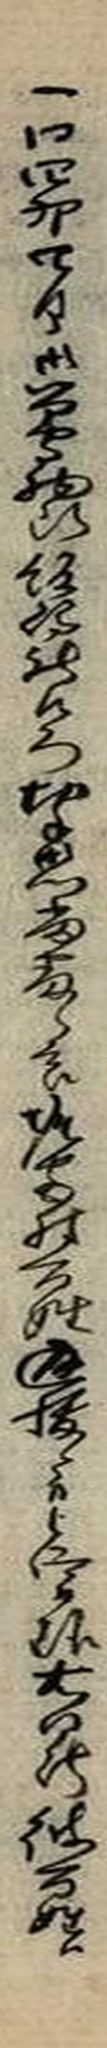一同四卯四月御留守物頭飯嶋新左衛門切手御門当番之節堀宮村百姓通抜候に付被仰付趣右々断彼百姓は
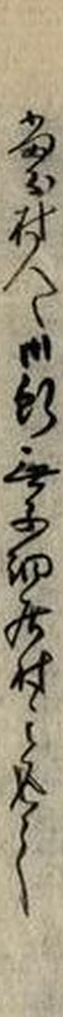当分村人之御預無子細居村へ被返之
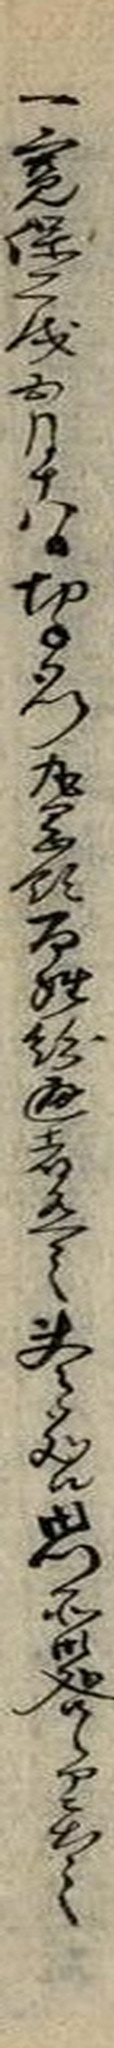一寛保二戌五月十八日切手御門丸岡領百姓紛通者有之夫々御咎御門所御咎之部に出之
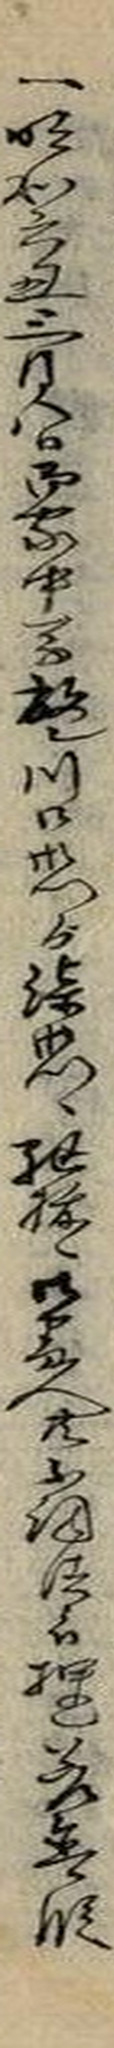一明和六丑三月八日御家中馬放レ川口御門ゟ漆御門へ駆抜候御番人共不調法に付押込差置候段
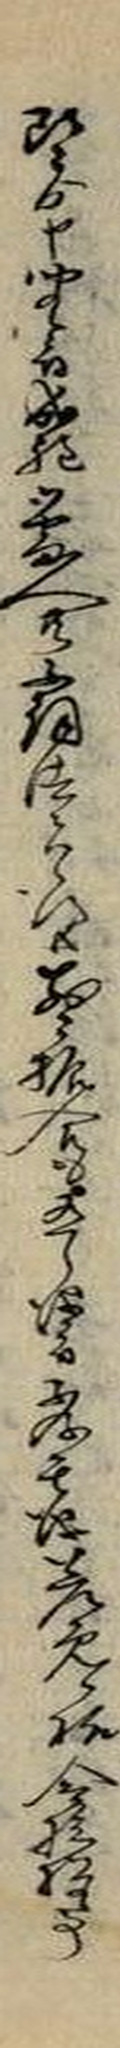頭々ゟ申聞候ニ付成程御番人共不調法ニハ候得共前々振合も有之儀ニ付不及其儀差免候様令挨拶候事
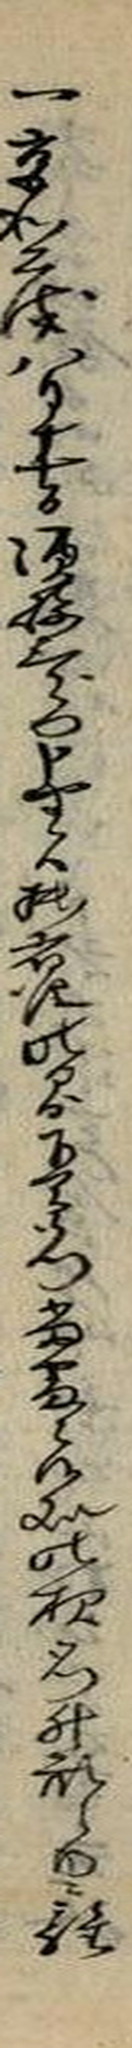一享和二戌八月十七日須藤三郎右衛門申聞候は拙者儀昨日ゟ下馬御門当番に候処昨夜御門枡形之内に雑
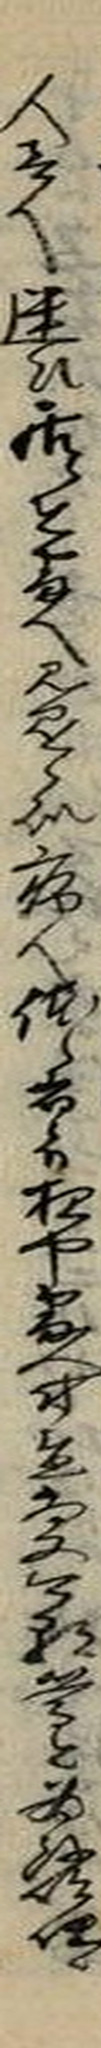人壱人迷ひ居候を番人見懸候処病人体之者に付夜中番人付置尚又今朝篤と為致吟味候
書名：御門御櫓之部
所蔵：福井県文書館 Fukui Prefectural Archives
